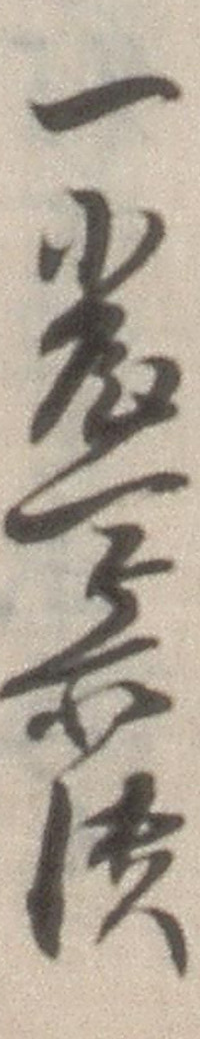一番所一ヶ所潰
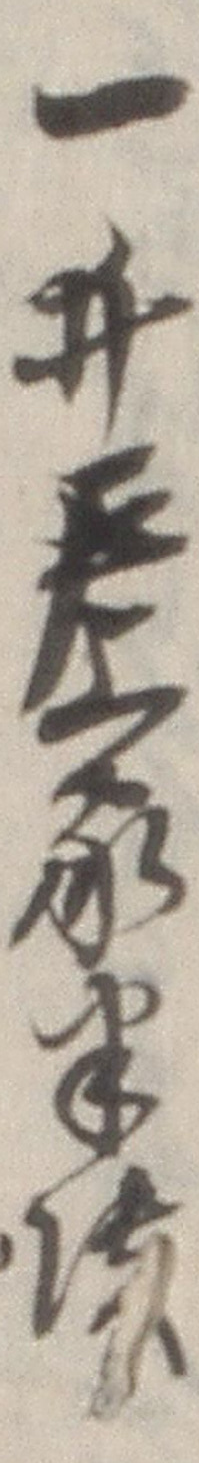一井戸上家半潰
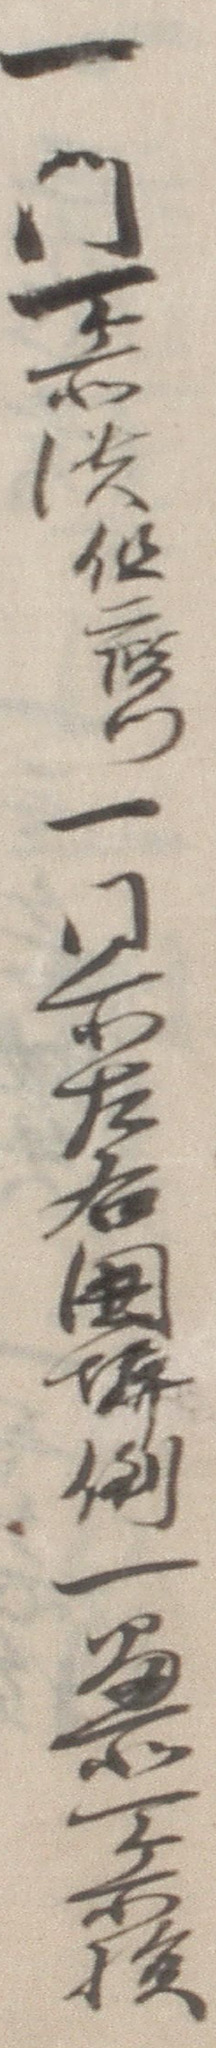一門一ヶ所潰但二階門一同所左右囲塀倒一番所一ヶ所損
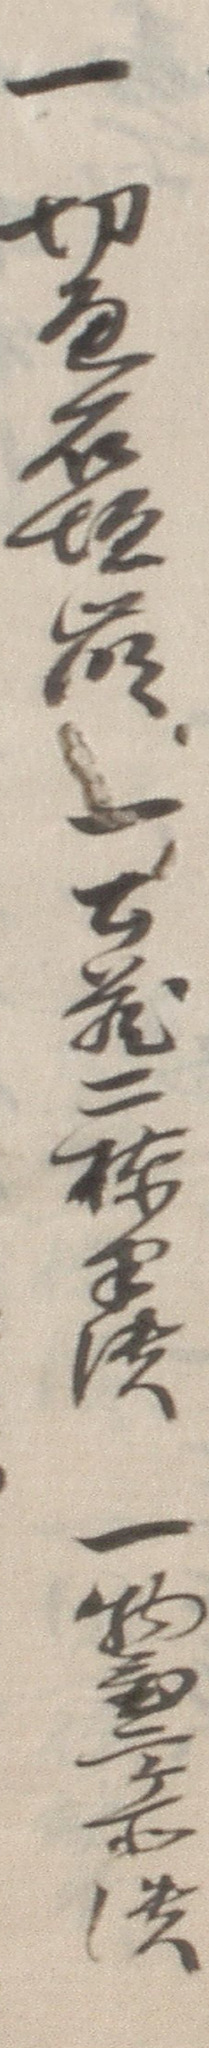一切通石垣落一土蔵二棟半潰一物置二ヶ所潰
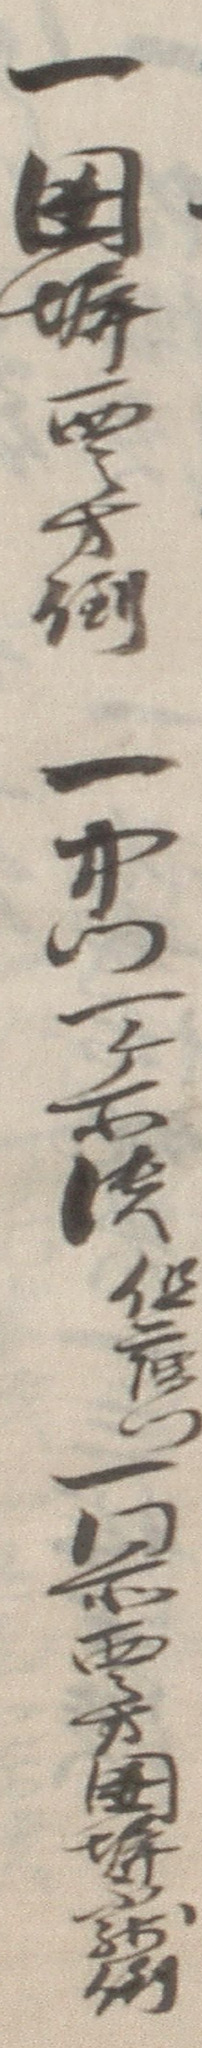一囲塀西之方倒一中門一ヶ所損但二階門一同所西之方囲塀不残倒
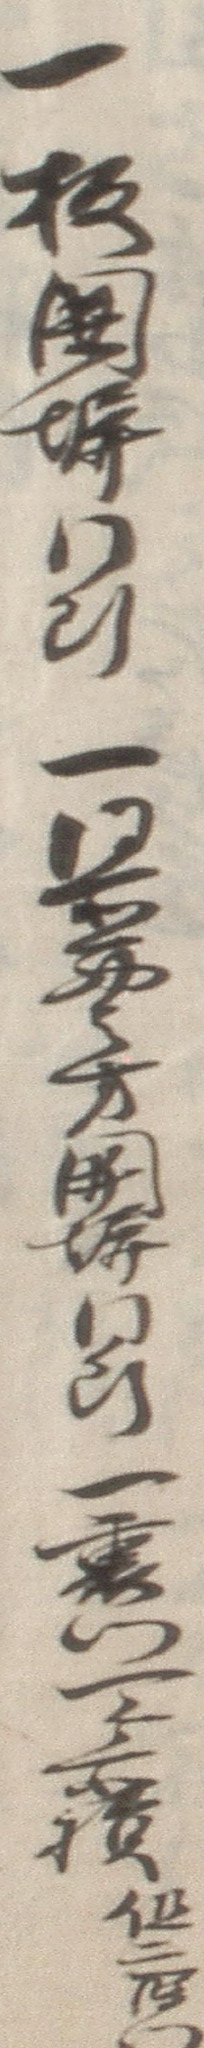一板囲塀同断一同所西之方囲塀同断一裏門一ヶ所潰但二階門
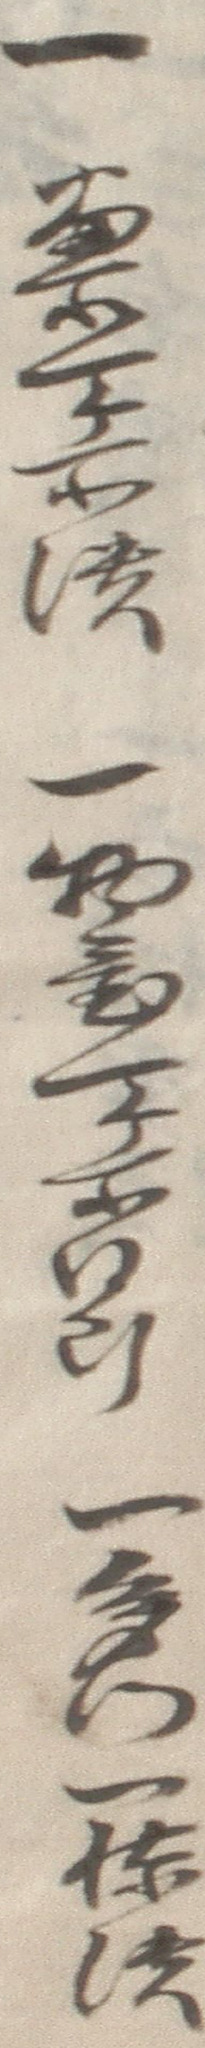一番所一ヶ所潰一物置一ヶ所同断一多門一棟潰
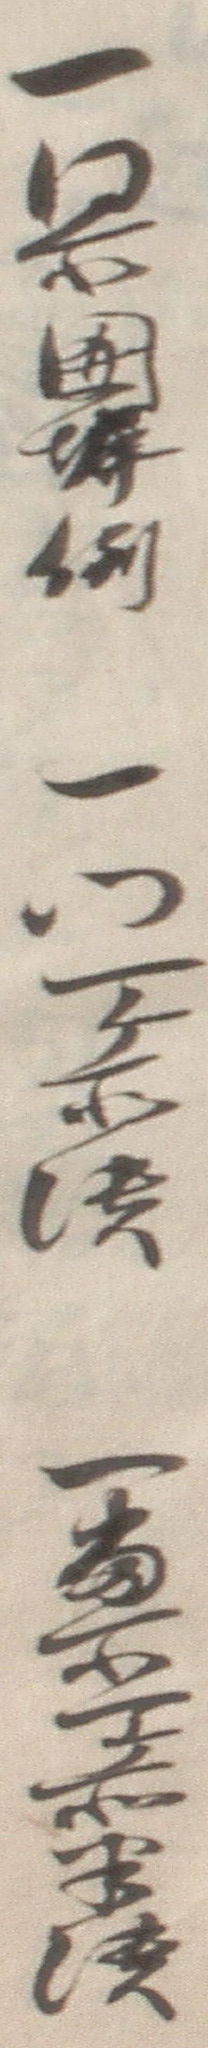一同所囲塀倒一門一ヶ所潰一番所一ヶ所半潰
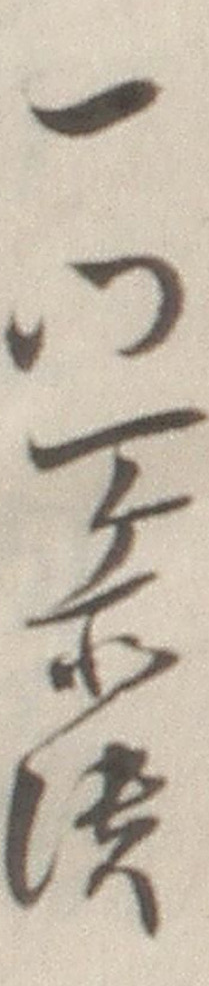一番所一ヶ所潰
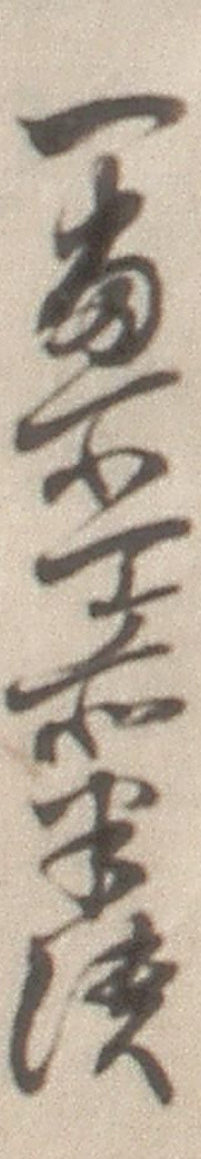一番所一ヶ所潰
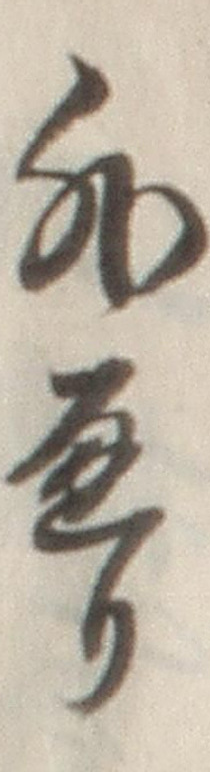外廻り
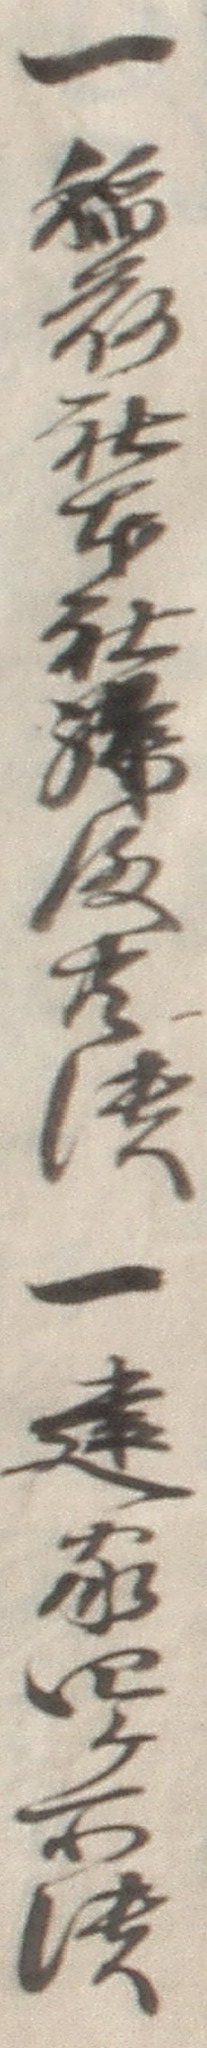一稲荷社本社拝殿共潰一建家四ヶ所潰
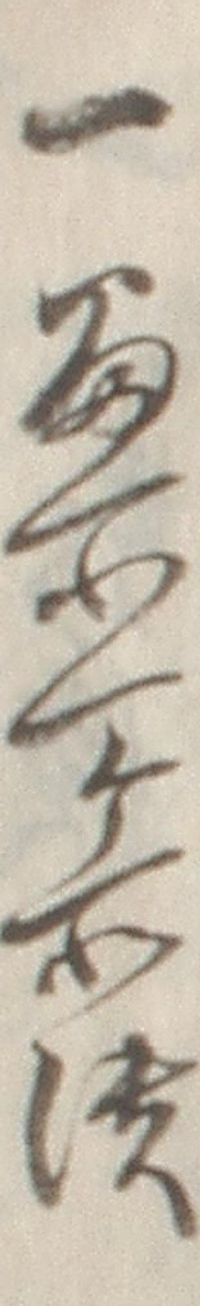一番所一ヶ所潰
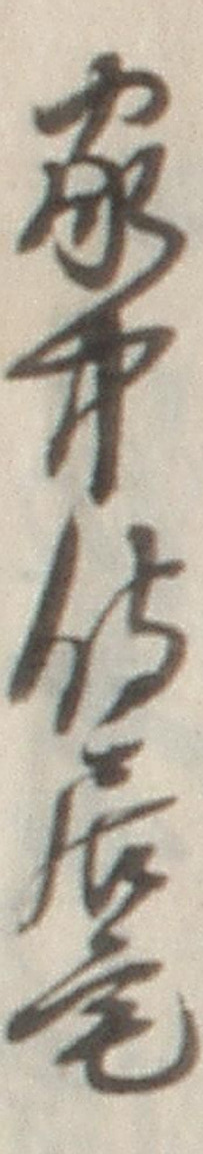家中侍居宅

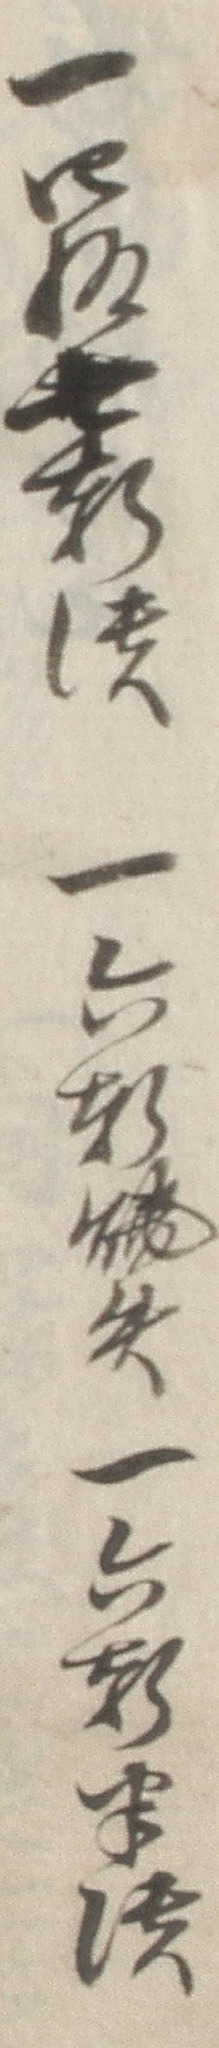一四拾七軒潰一六軒焼失一六軒半潰
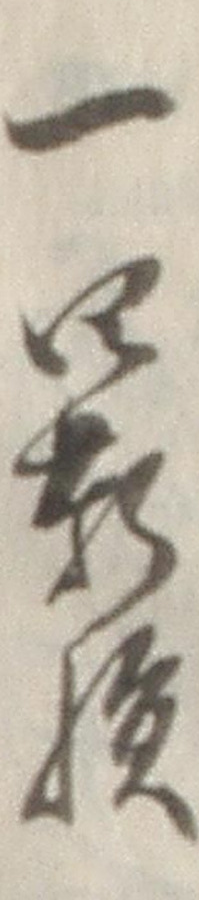一四軒損
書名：信州地震一件
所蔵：東京大学地震研究所図書室 Earthquake Research Institute Library, The University of Tokyo, JAPAN
